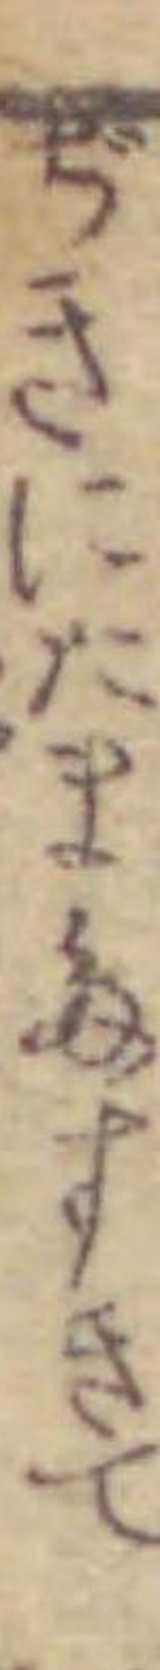ぢきにたまたすきて
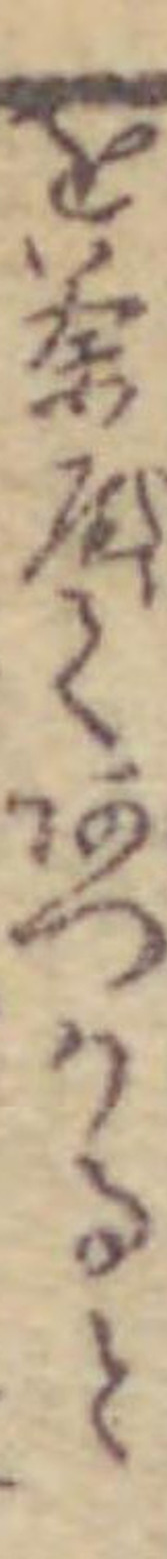を茶屋てあつかると
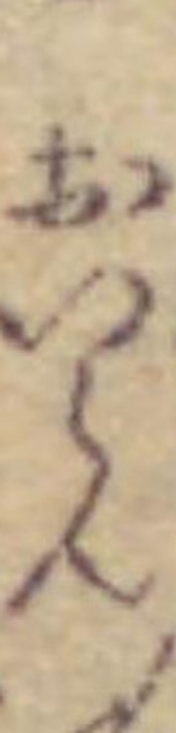おいらん
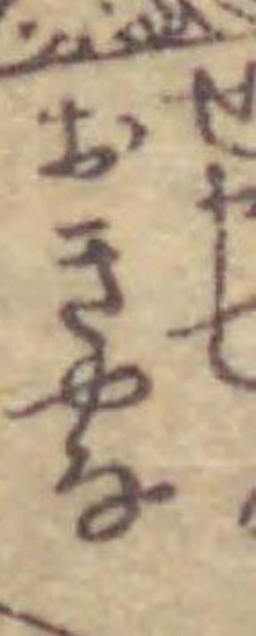おきやな
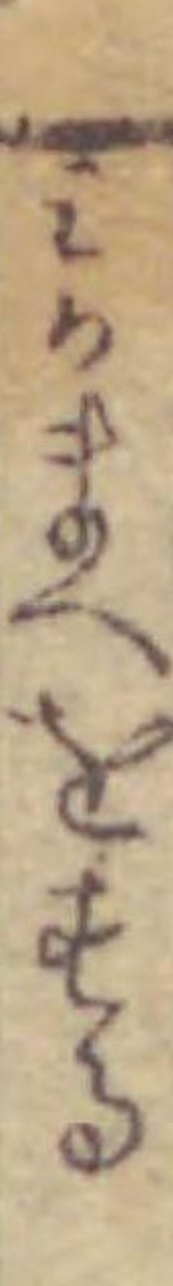みかまへをする
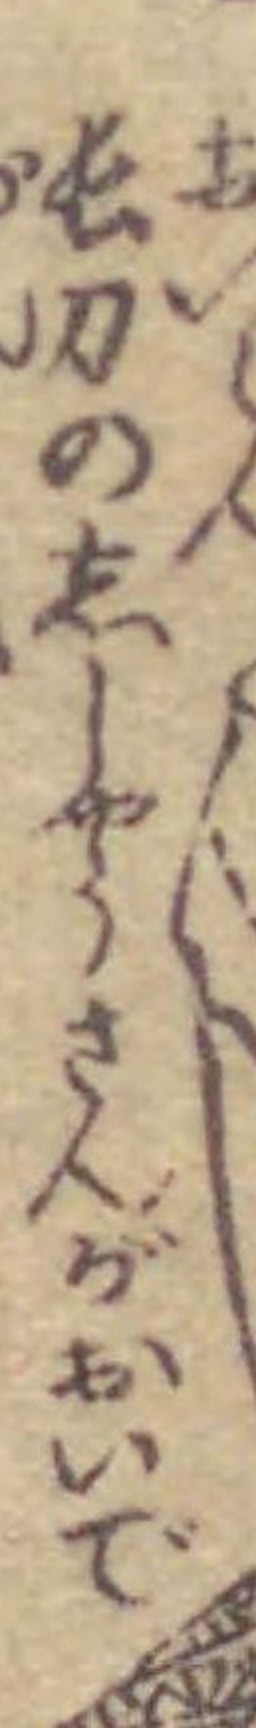長刀のししやうさんがおいで
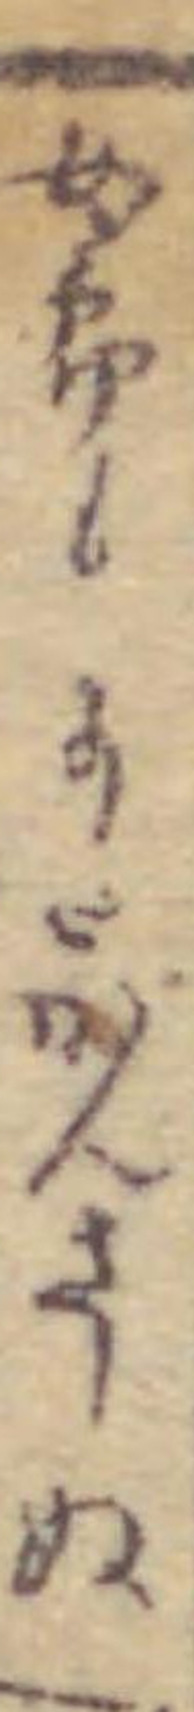女郎もまたかんさしぬ
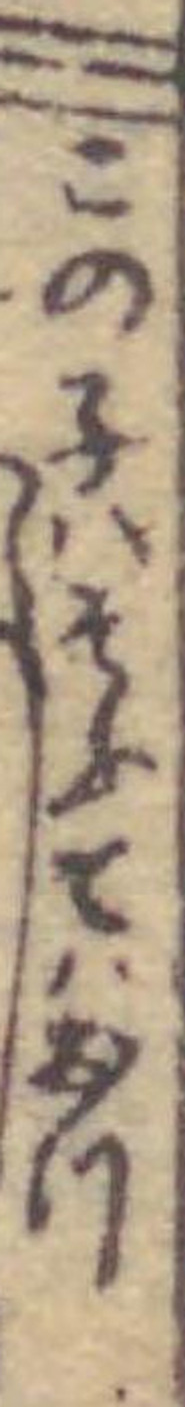この子はそふてはおつ
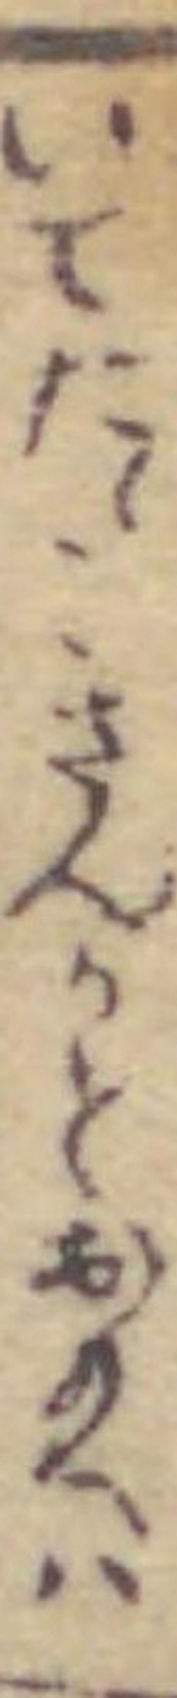いてたゝみさんかとおもへは
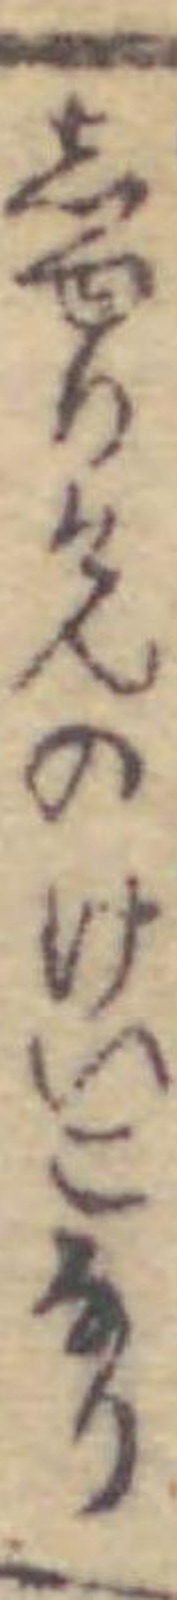しゆりけんのけいこなり
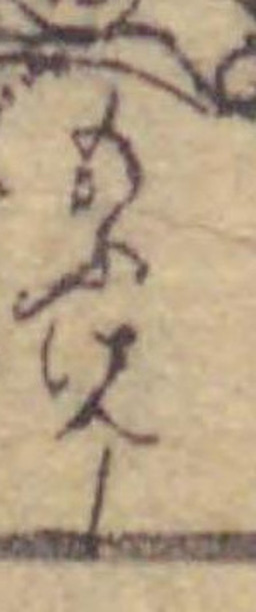もふけんし
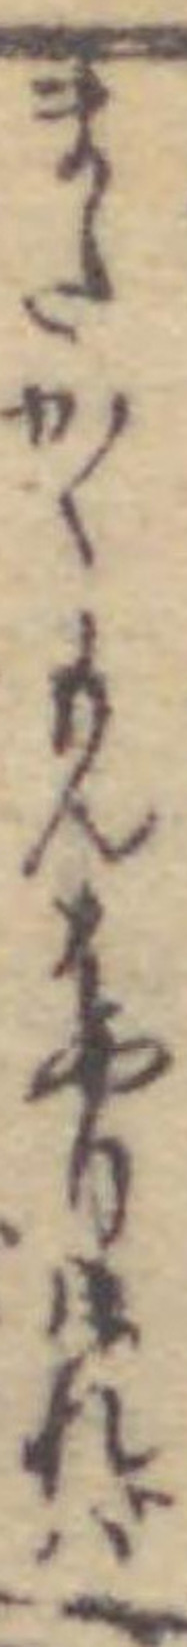またかくもんはやりければ
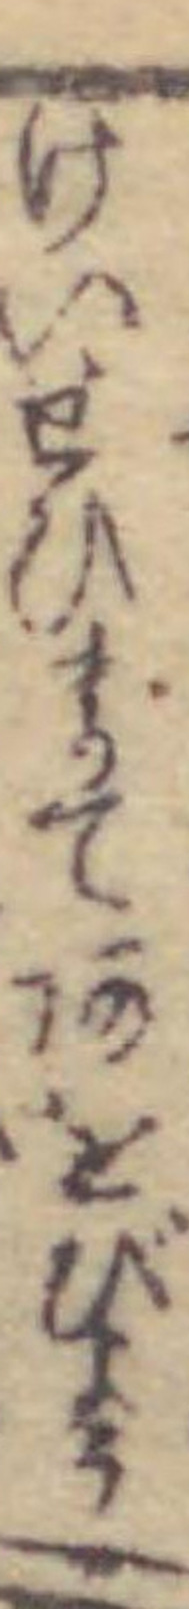けいせひまてあをびよう
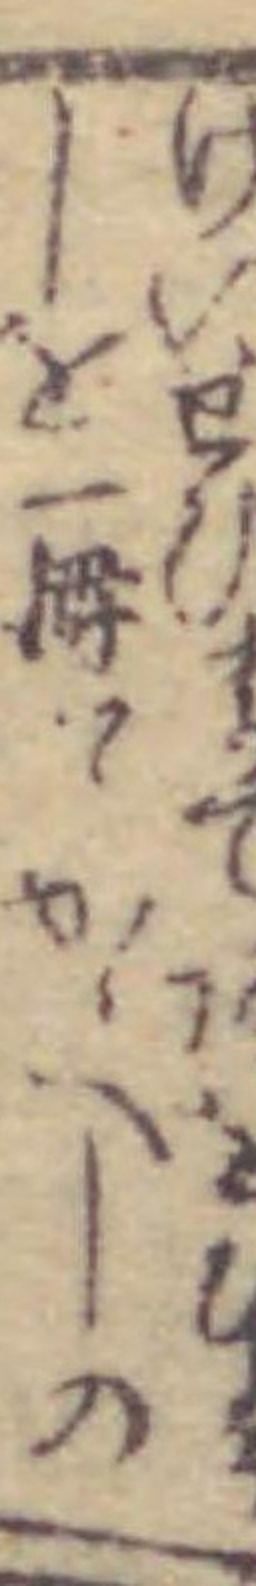しを一冊つゝかゝへしの
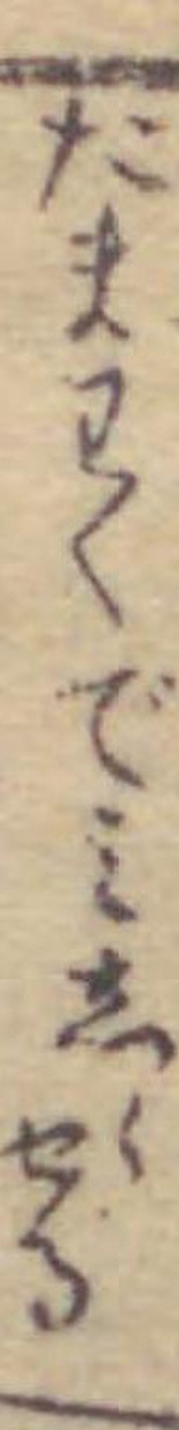たまわくでみしらせる
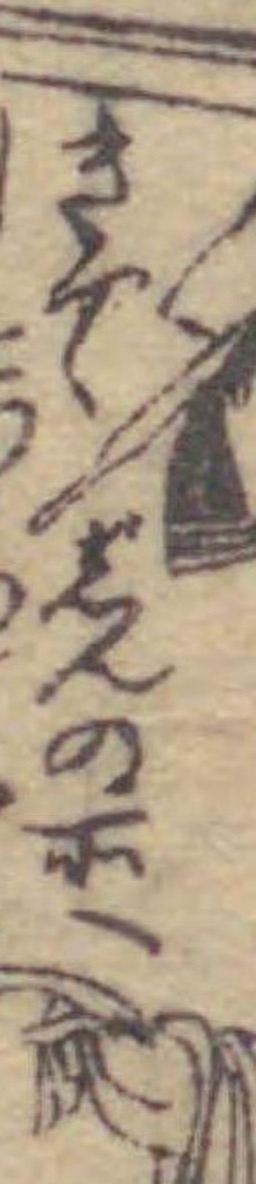きやくしんの所へ
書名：天下一面鏡梅鉢 : 3巻
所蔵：国立国会図書館 National Diet Library, JAPAN
